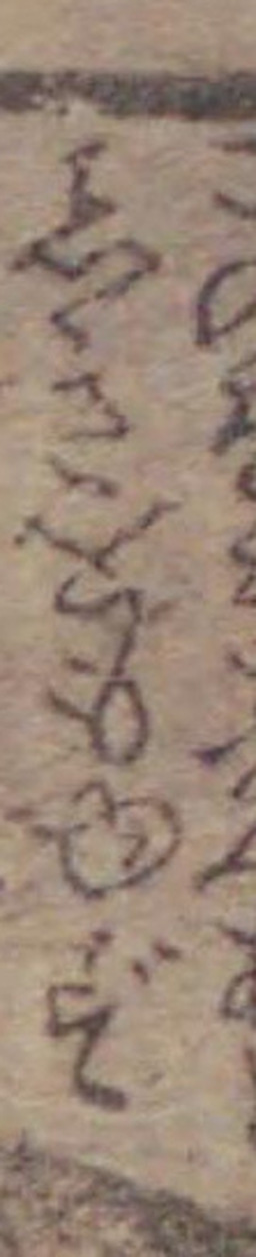しきをもゆず
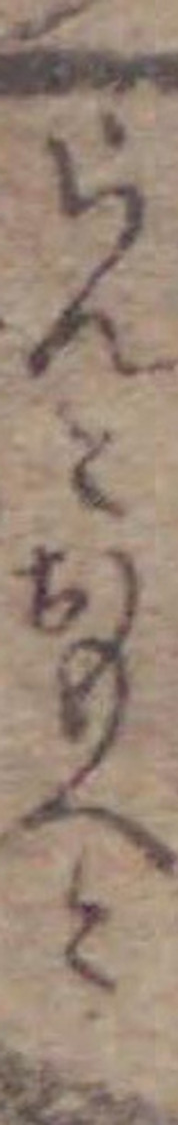らんとおもへと
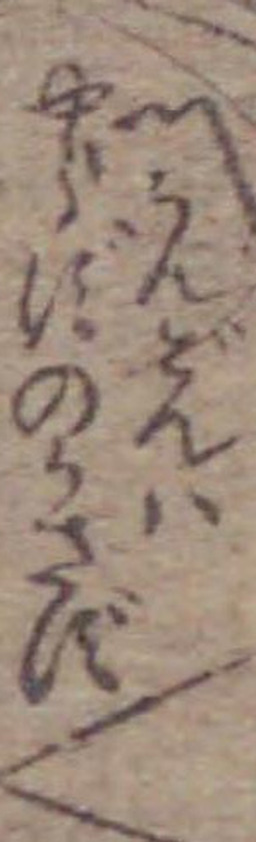やらずのかさず
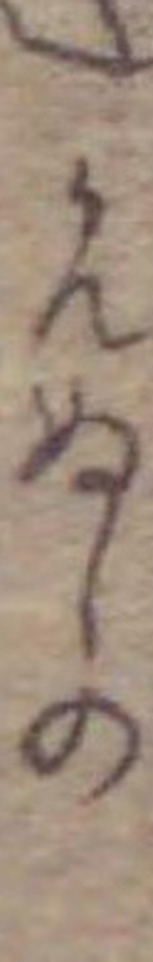かんぬしの
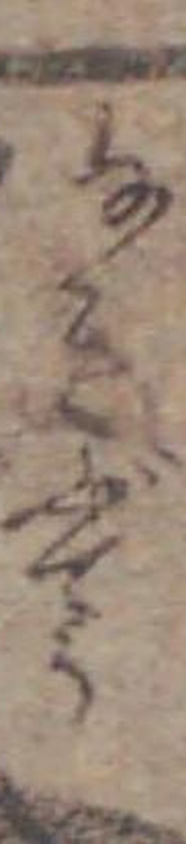なきぶてう
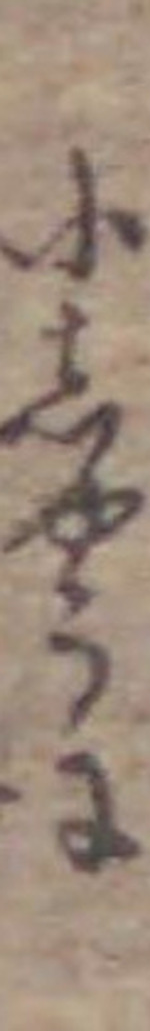小しやうに
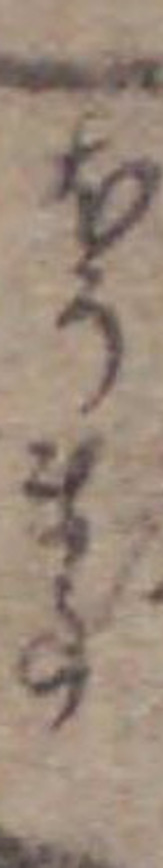ほうま事
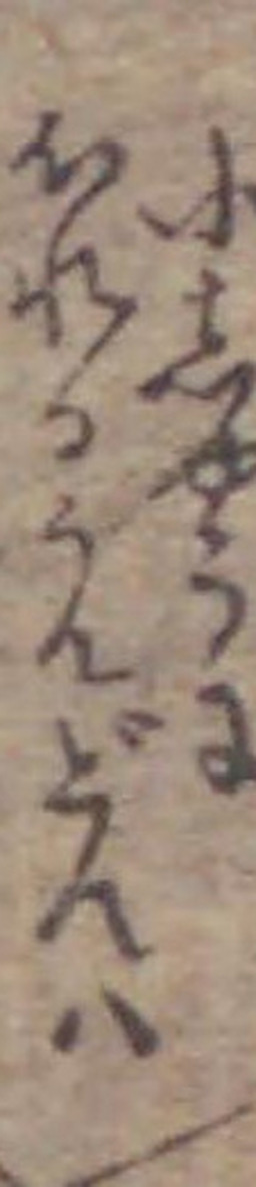ほれるうんどんは
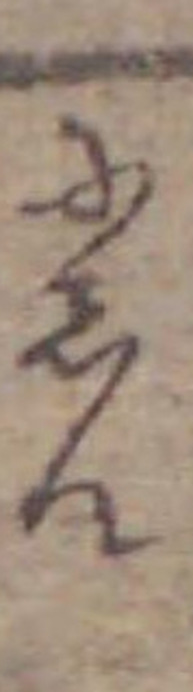にしん
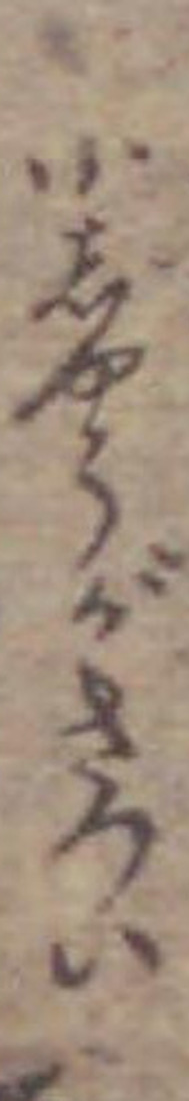小しやうがきつい
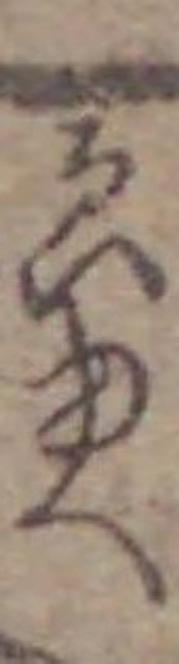るいゆへ
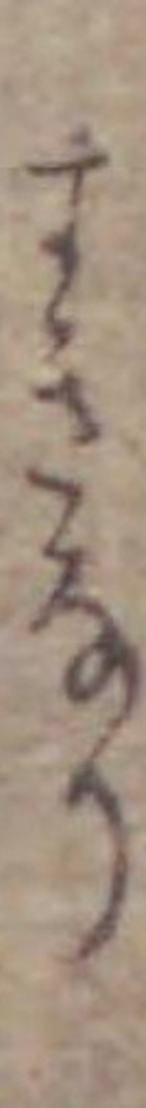すきなり
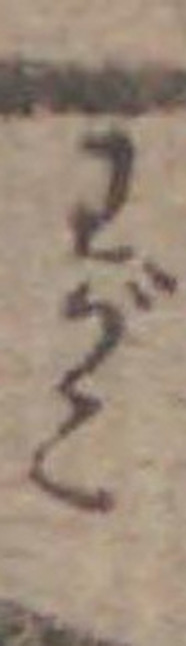わがこ
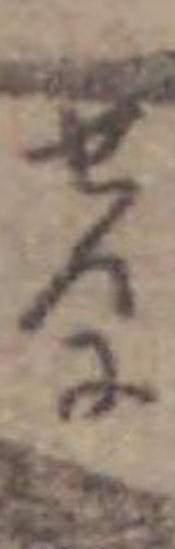せんに
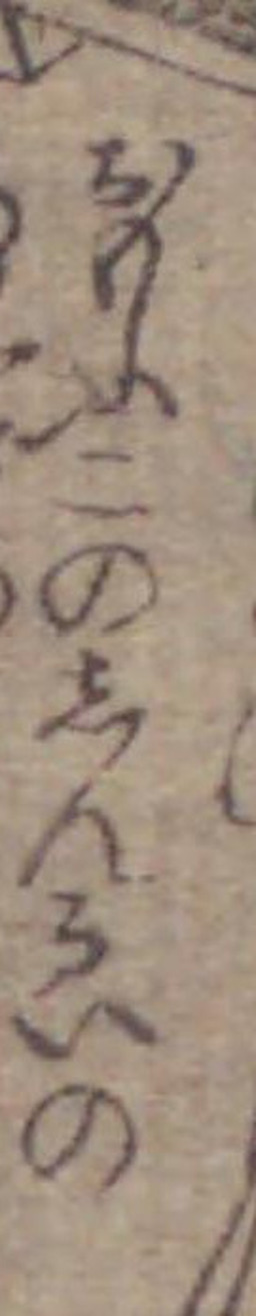おもふこのしんるいの
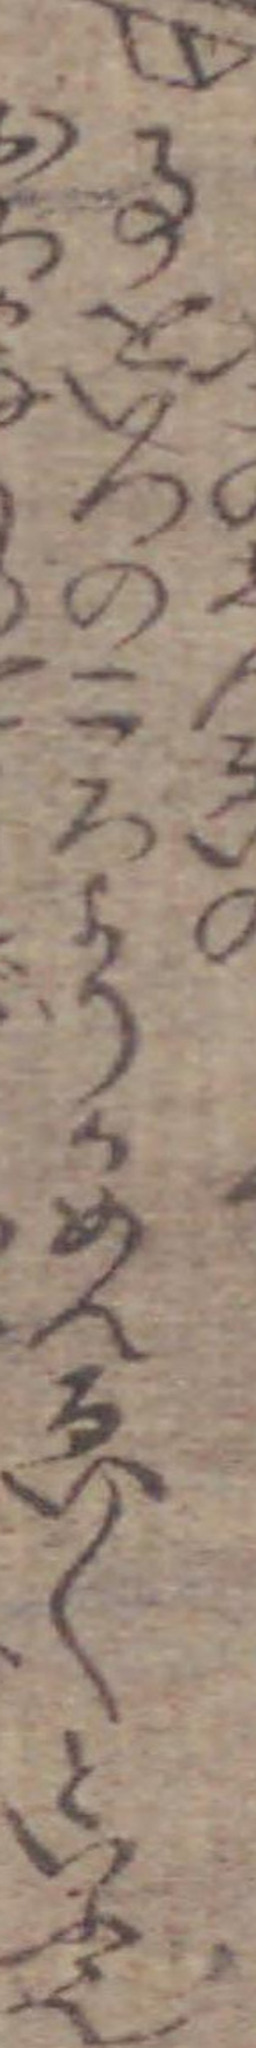事をいつのころよりかめんるい〳〵といふ也
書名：諸事米の飯 : 3巻
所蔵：国立国会図書館 National Diet Library, JAPAN
